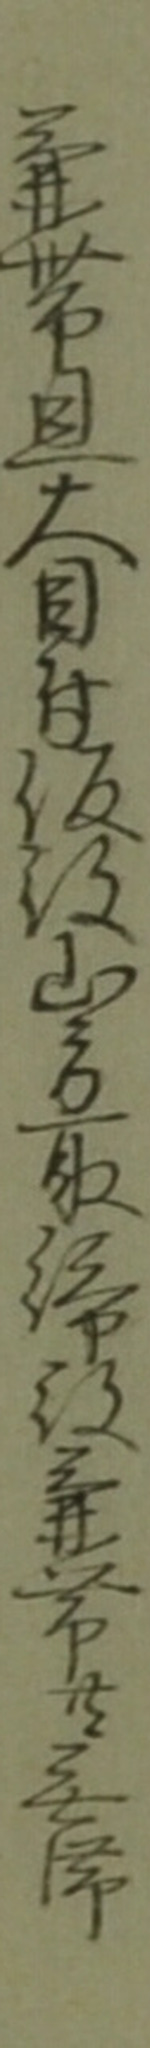兼帯且大目付仮役山方取締役兼帯共無滞
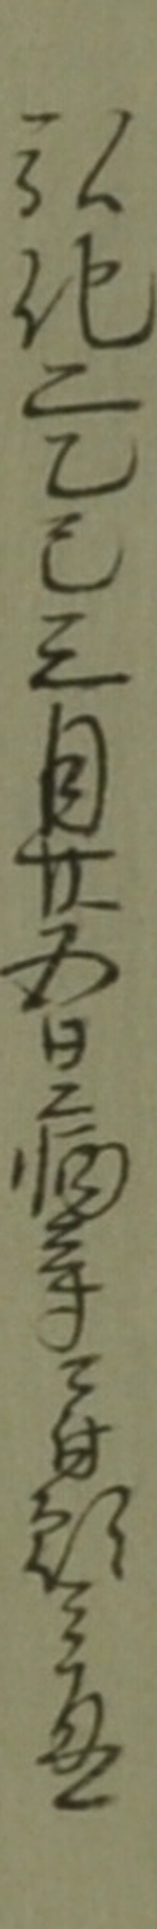一弘化二乙巳三月廿五日病気ニ付願之通
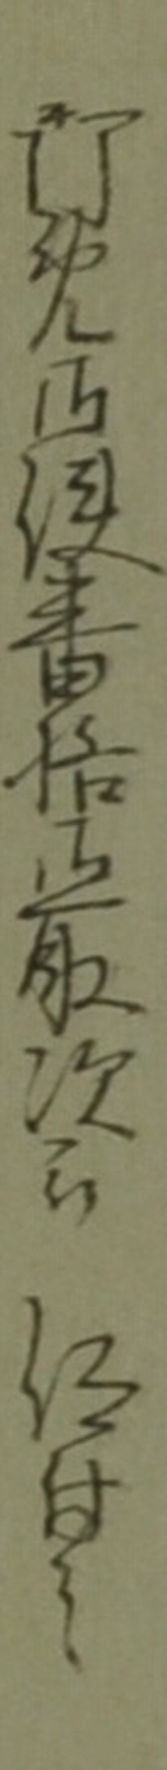御免御使番格御取次被仰付之
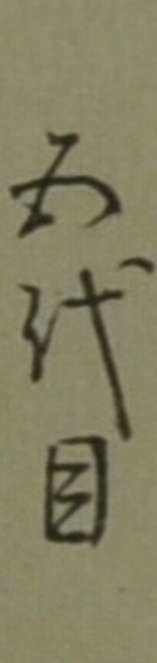五代目
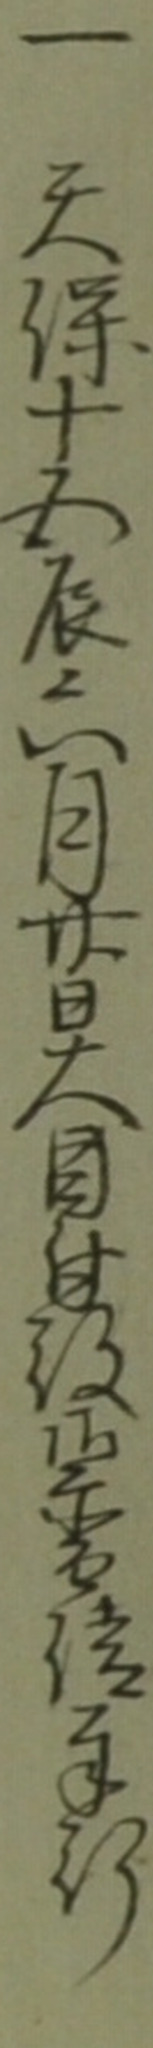一天保十五辰六月廿日大目付役御普請奉行
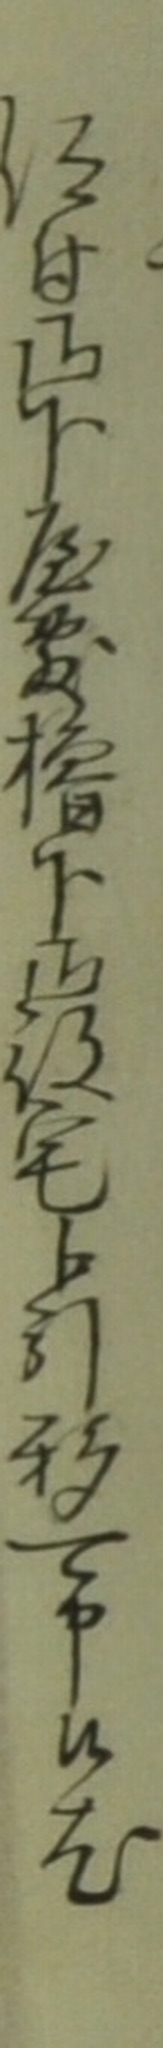仰付御下屋敷櫓下御役宅江引移可申候尤
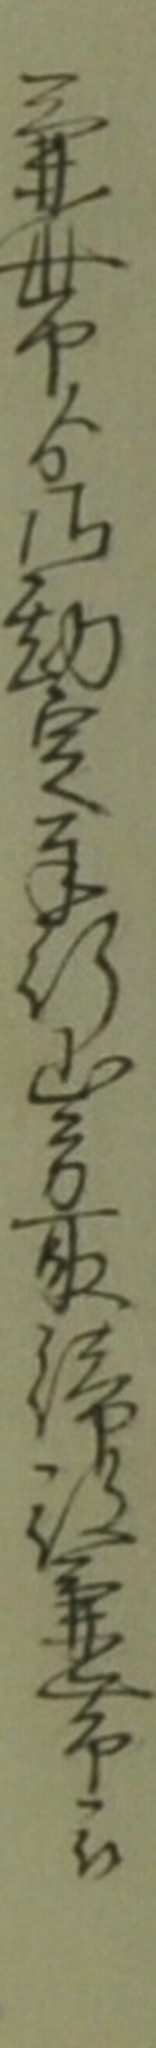兼帯ゟ御勘定奉行山方取締役兼帯被
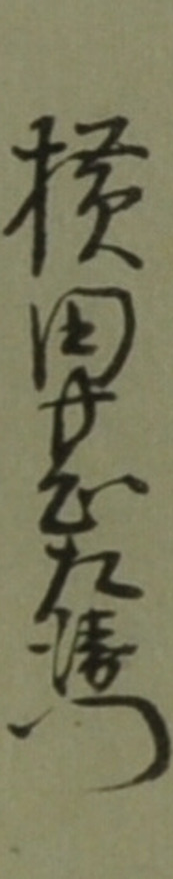横田甚左衛門

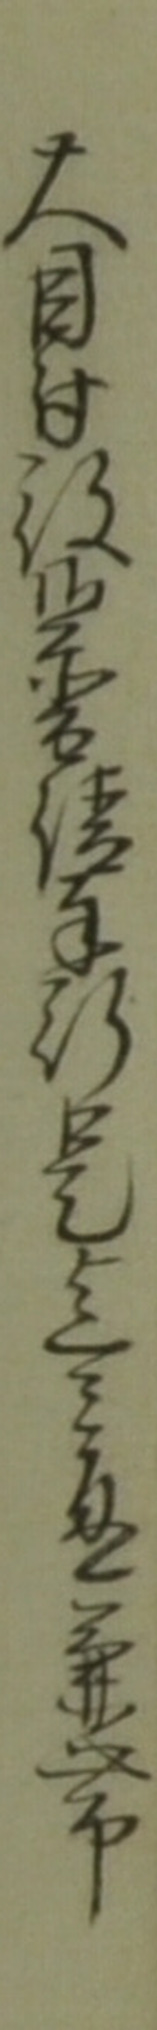大目付役御普請奉行是迄之通兼帯

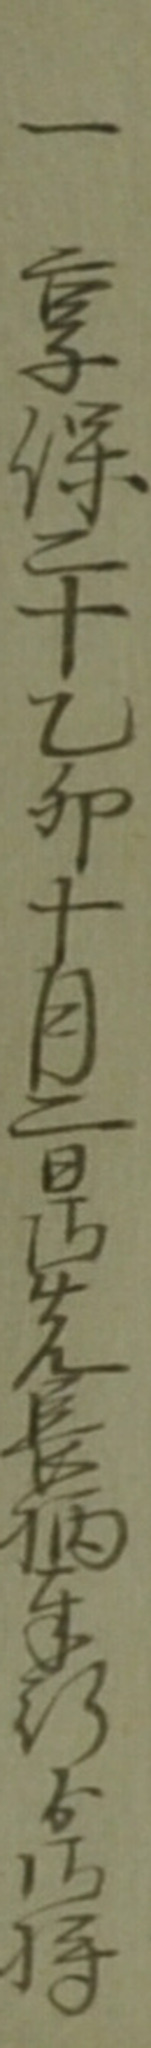一享保二十乙卯十月二日御先長柄奉行ゟ御持
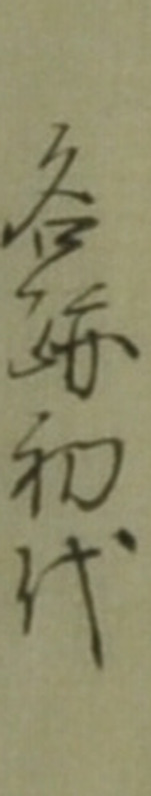名跡初代
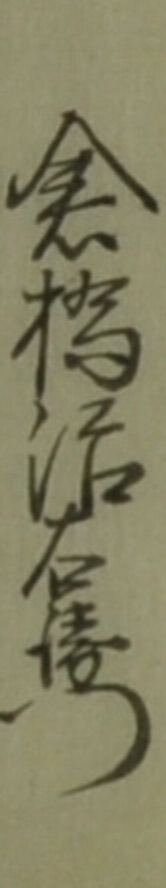倉橋治右衛門
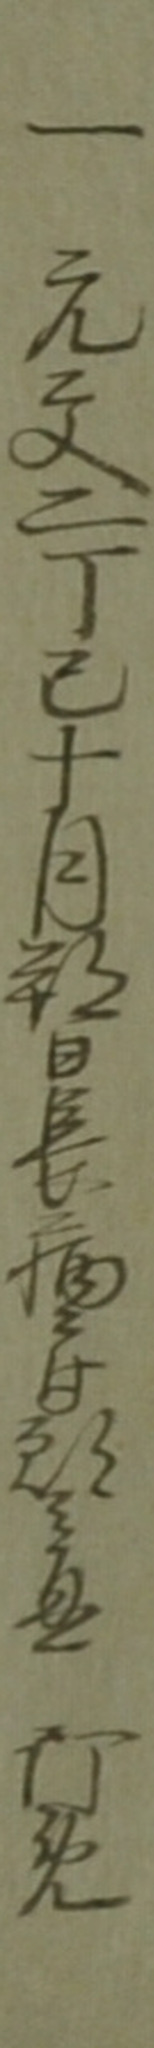一元文二丁巳十月朔日長病ニ付願之通御免
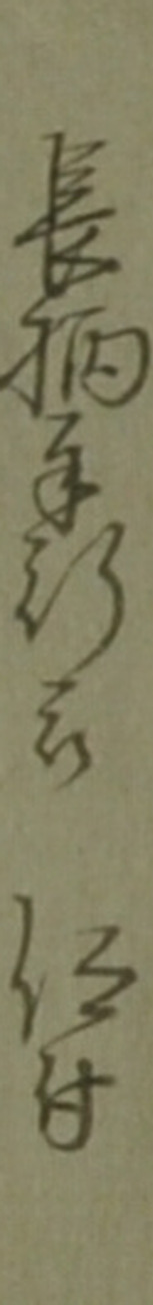長柄奉行被仰付
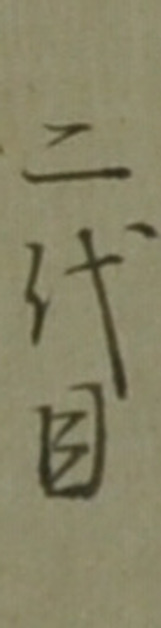二代目
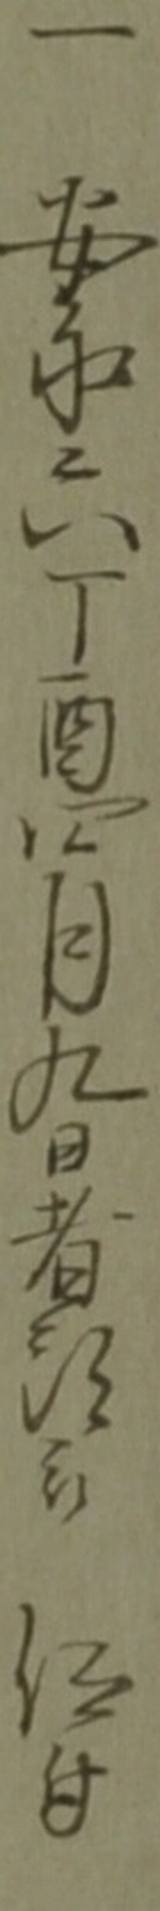一安永六丁酉四月九日者頭被仰付
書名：諸御役代々録（三）
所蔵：伊那市立高遠町図書館・合同会社AMANE
